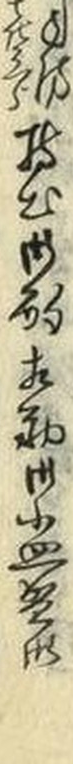喜三郎持出御酌相勤御小皿盛御
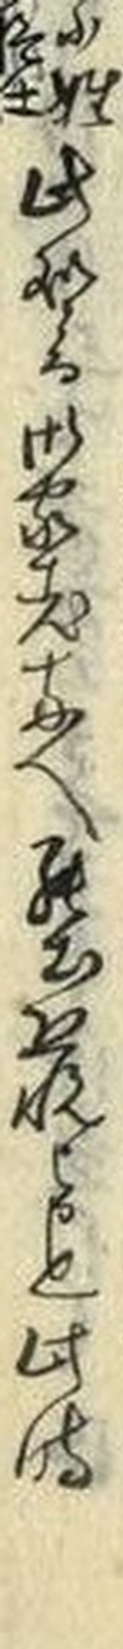御給仕此処ニ而御家老両人罷出恐悦被申上此時
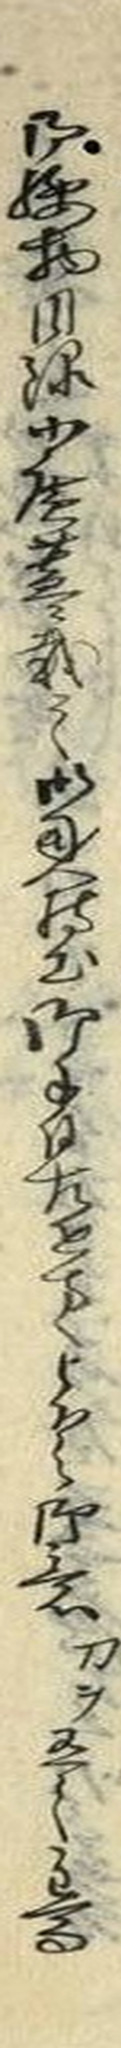御腰物目録小広蓋ニ載之御用人持出御手自左近方へ被下之御意刀ヲ有之主馬

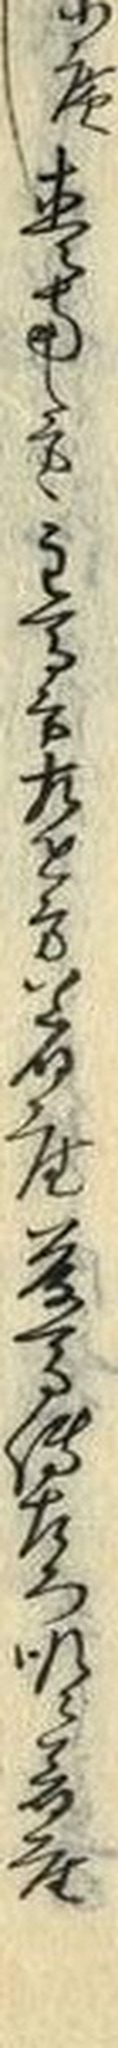蓋引之直ニ南之方へ主馬方左近方着座藤馬伝左衛門順ニ着座
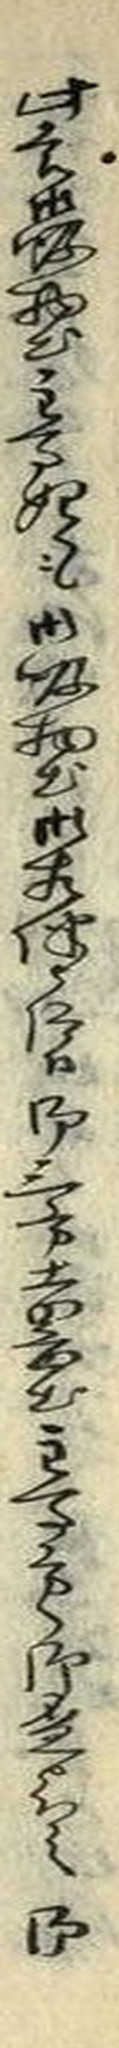此節御吸物出主馬始へも御吸物出御相伴被仰付御三方土器出主馬方へ御盃被下之御
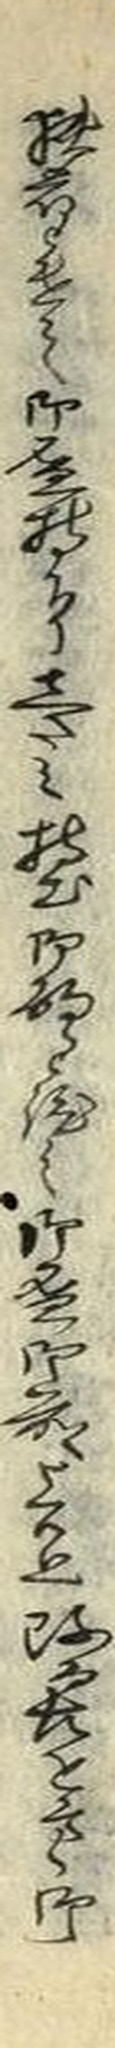挟肴被遣之御盃持下りしたみ持出御酌へ被渡之御盃御前へ被召上改而左近方へ御
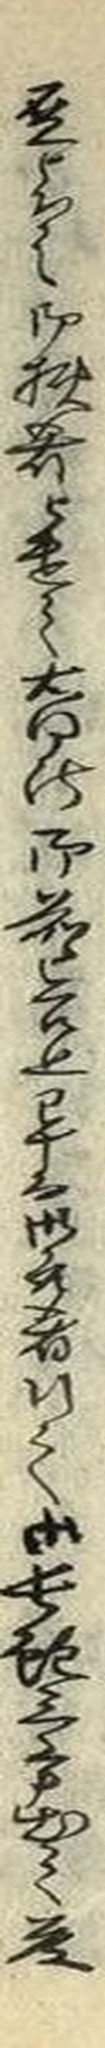盃被下之御挟肴被遣之右同断御前被召上畢而御取肴引之御長鮑三方出之藤
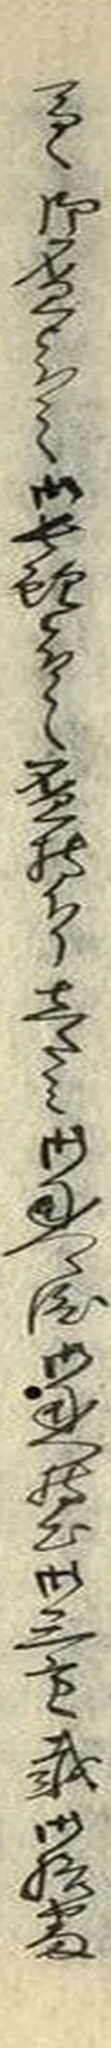馬へ御盃被下之御長鮑被下之盃持下りしたみ御用人へ渡御用人持出御三方へ載御膳番
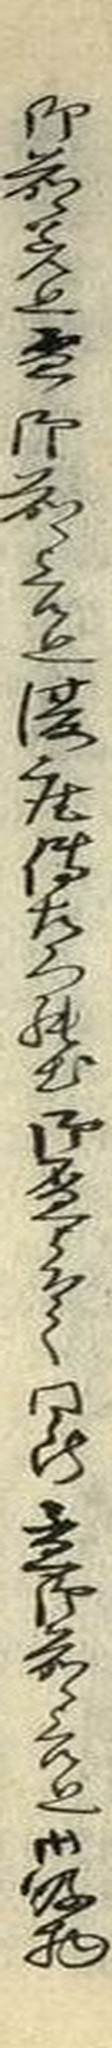御前へ差上盃御前へ被召上復座伝左衛門罷出御盃被下之同断盃御前へ被召上御吸物
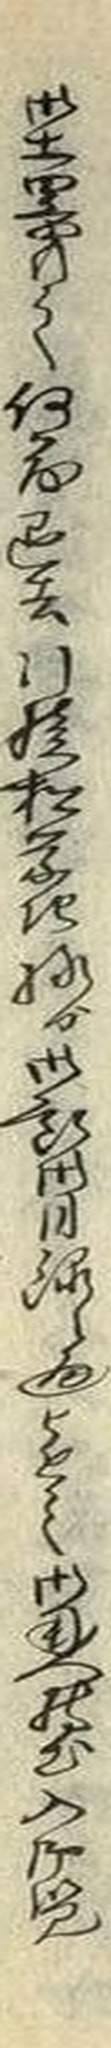御土器引之何茂退去引続松栄院様ゟ御影御目録之通被進之御用人持出入御覧
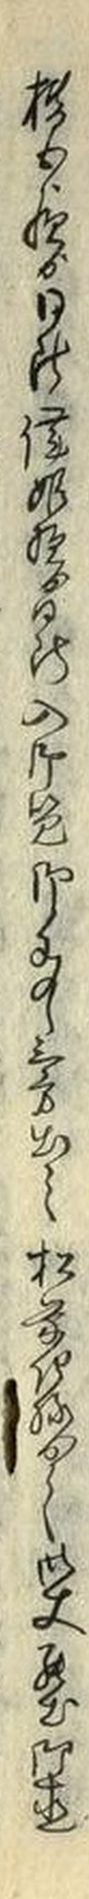楷五郎様ゟ同断謹姫様ゟ同断入御覧御手のし三方出之松栄院様ゟ之御使罷出御直
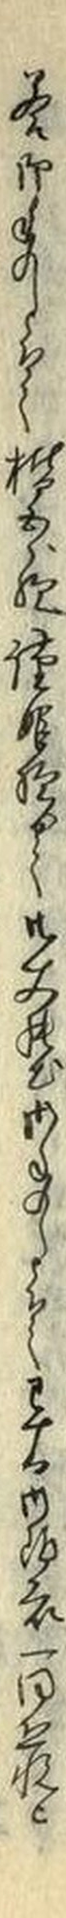答御手のし被下之楷五郎様謹姫様ゟ之御使罷出御手のし被下之畢而御附衆一同恐悦被
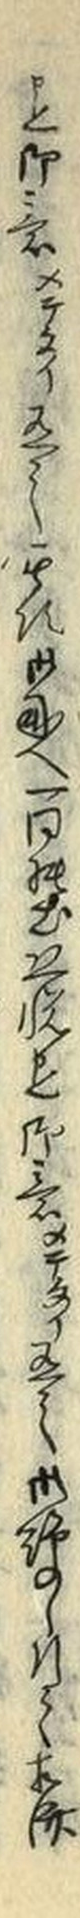申上御意メテタイ有之其次御用人一同罷出恐悦申上御意メテタイ有之御飾のし引之相済
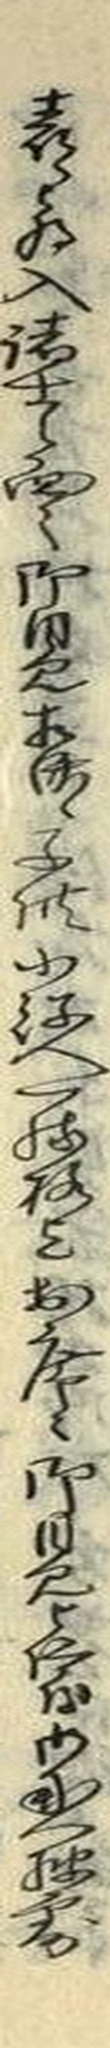表へ被為入諸士之面々御目見相済候子供小役人一統格迄於席々御目見被仰付御用人披露
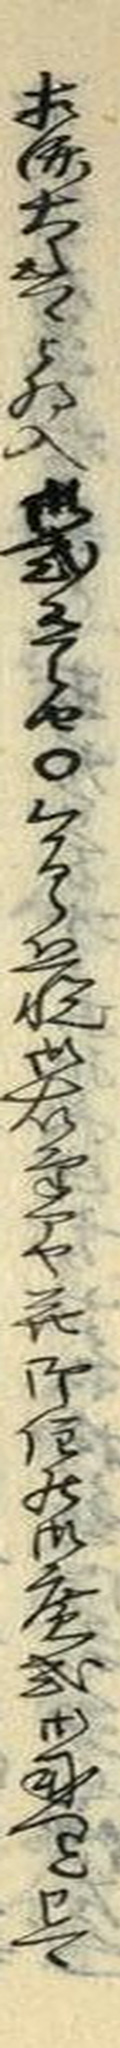相済大奥へ被為入御式有之由〇今日之恐悦御右筆部屋幷御住居御広式御用人迄申上候
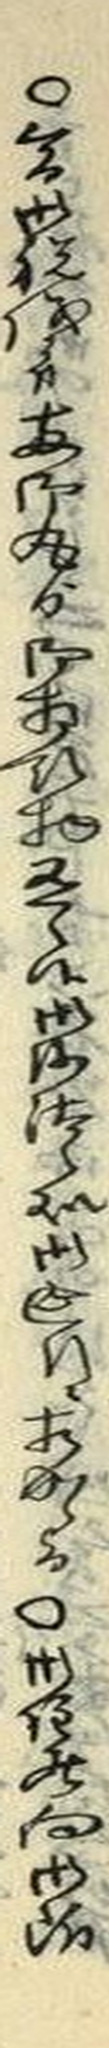〇今日御祝儀ニ付両御丸ゟ御拝領物有之候御沙汰之処御延引ニ相成候旨〇御住居向御附
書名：少傅日録抄（斉善付側向頭取日記、在府）
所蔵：福井県文書館 Fukui Prefectural Archives
